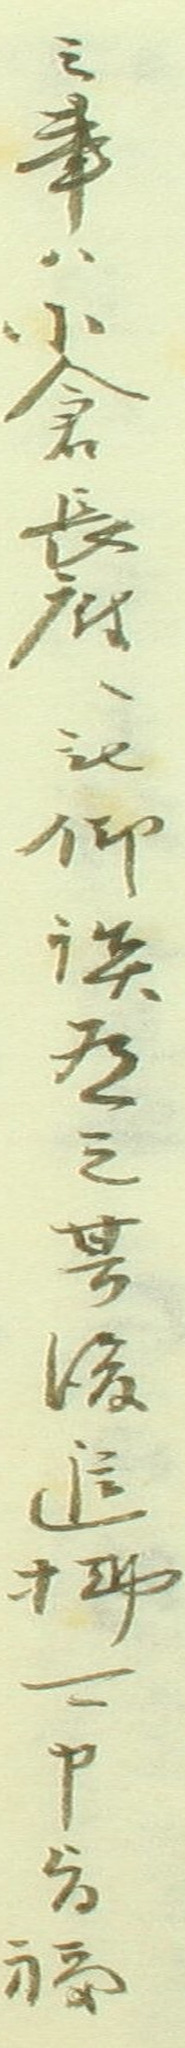之事は小倉長府へ被仰誤有之其後追払可申旨福
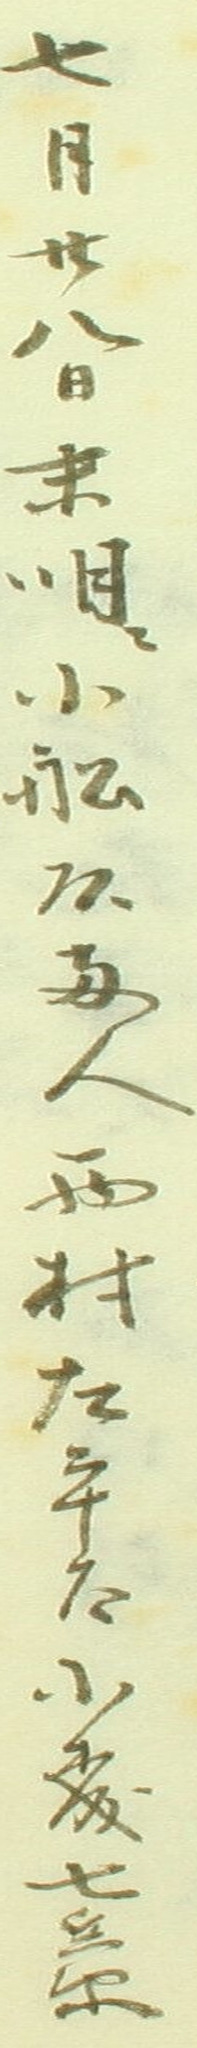七月廿八日未明に小船頭両人西村左平太小藤七兵衛
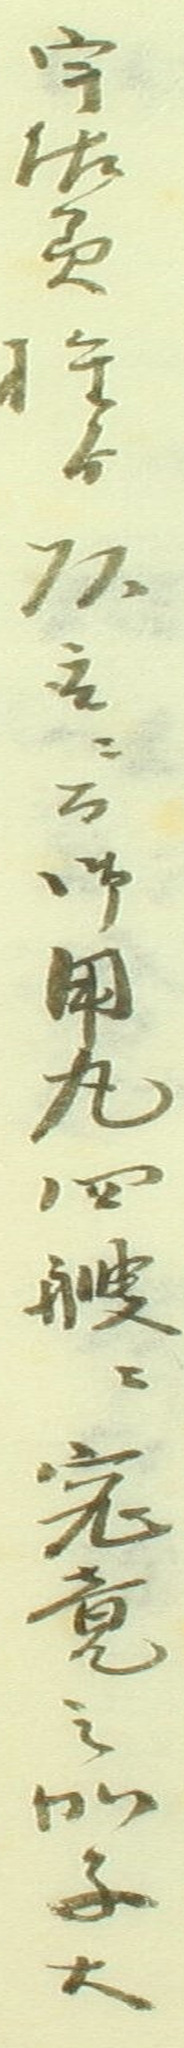宇佐美権ゟ頭取に而御用丸四艘に容竟之加子大
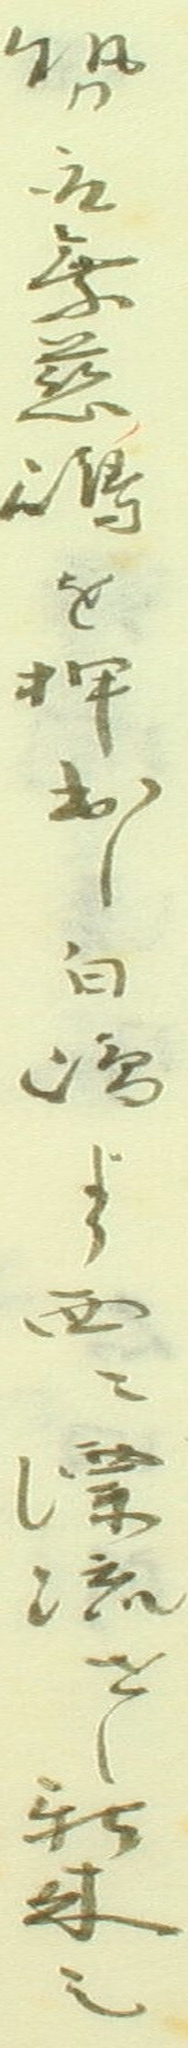勢取乗慈嶋を押出し白嶋ゟ西に漂流せし新来之
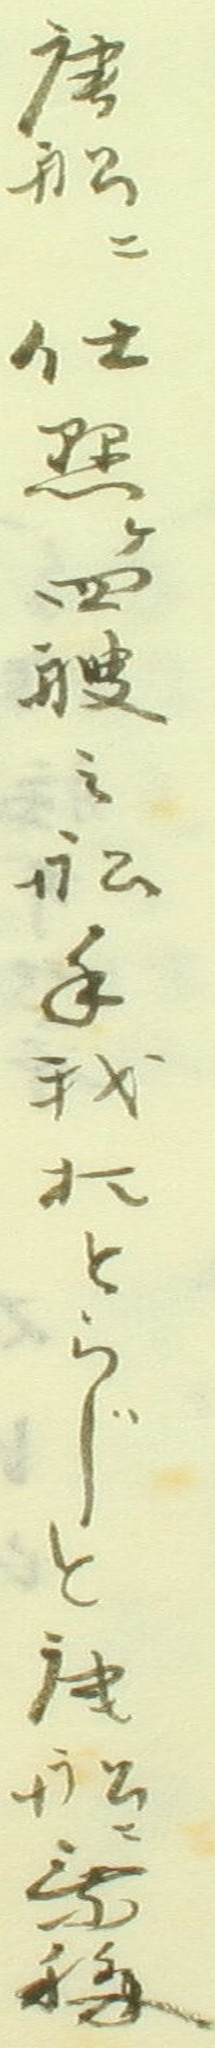唐船に仕懸け四艘之船子我？とらじと唐船乗移
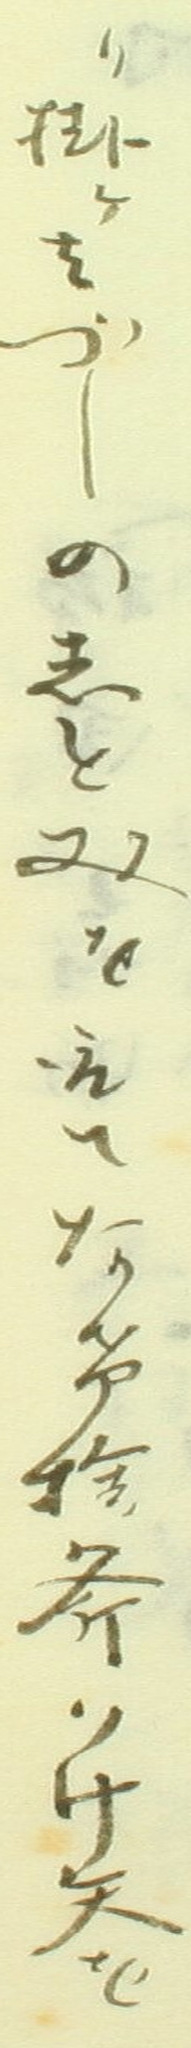り掛けはづしのしとみを取てなけ捨斧かけ矢を
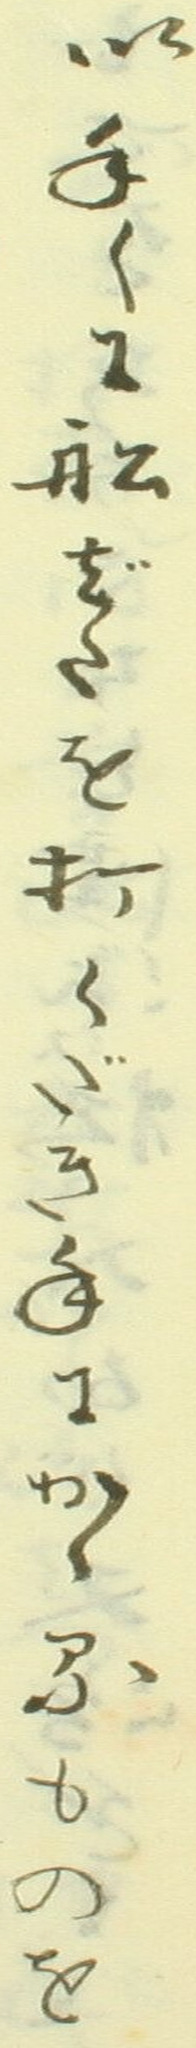い手い手に船ばたを打くだき手にかかるものを
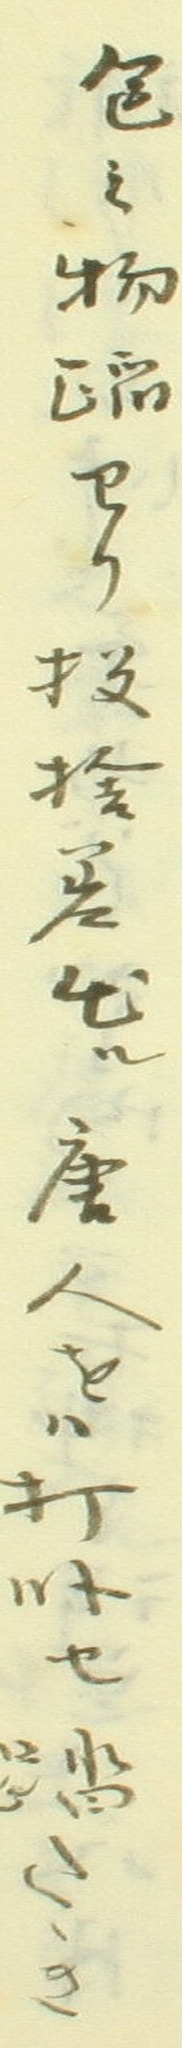包之物臨せり投捨差出る唐人を打臥せ踏たたき
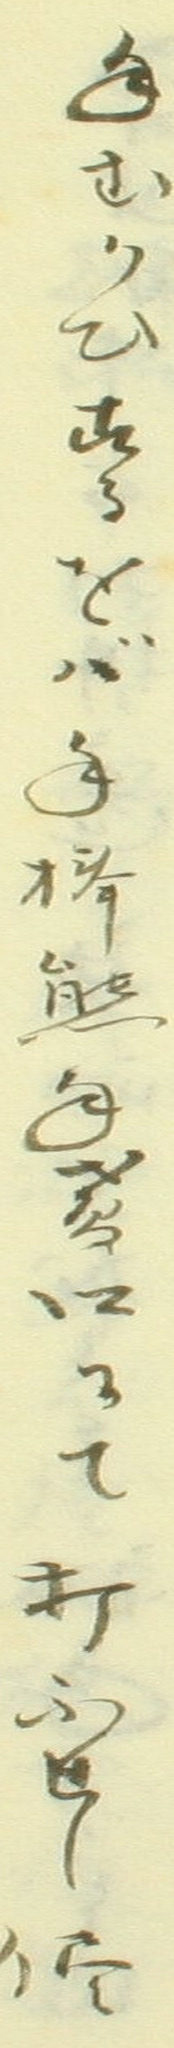手むかひするをば手棒熊手鳶口にて打ふせし侭
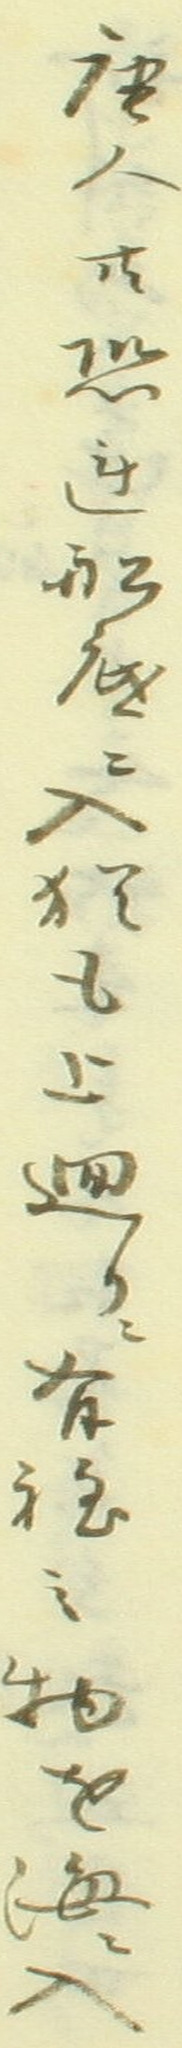唐人共恐れ船底に入猶も上廻りに有程之物を海に入
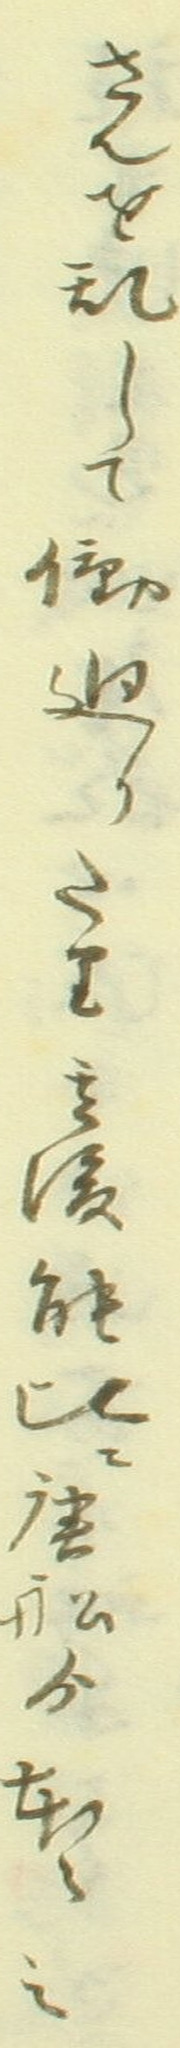さんを乱して働廻りたり其後能頃に唐船ゟ本本之
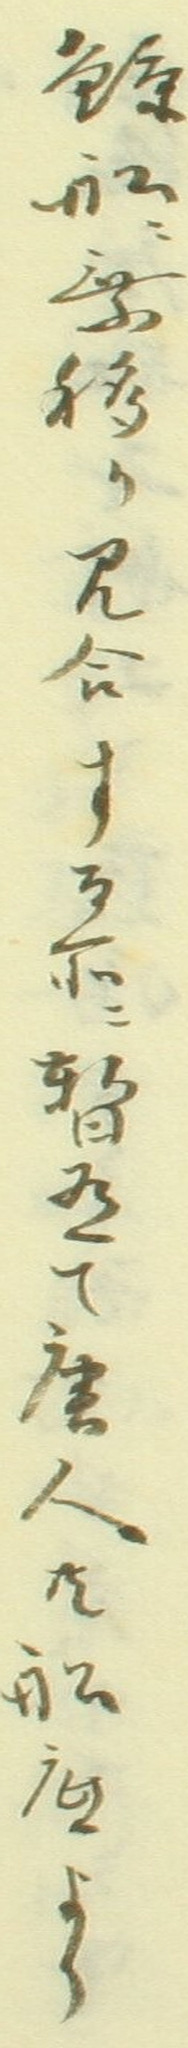？船に乗移り見合する所に暫有て唐人共船底より
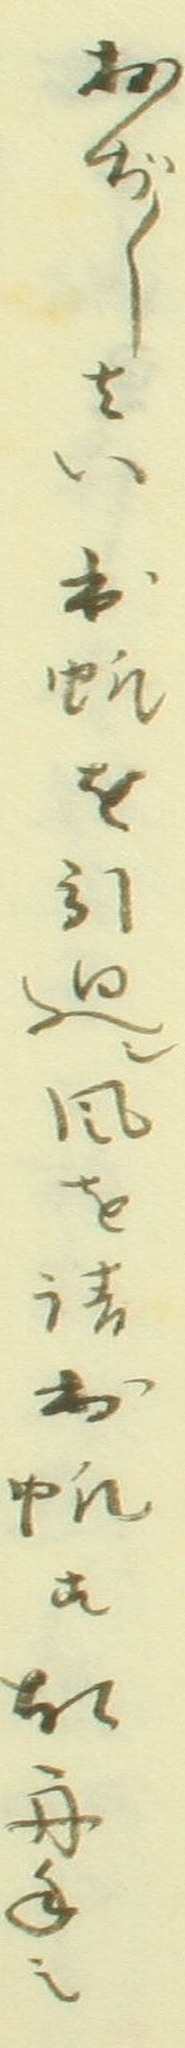おぢおぢはい出帆を引廻し風を請け出帆す故舟手之
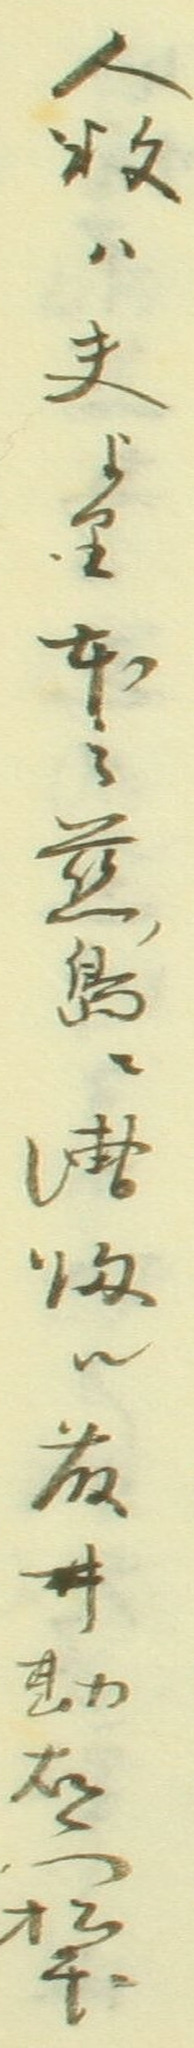人数は夫より本之慈嶋に漕帰る藤井勘右衛門松本
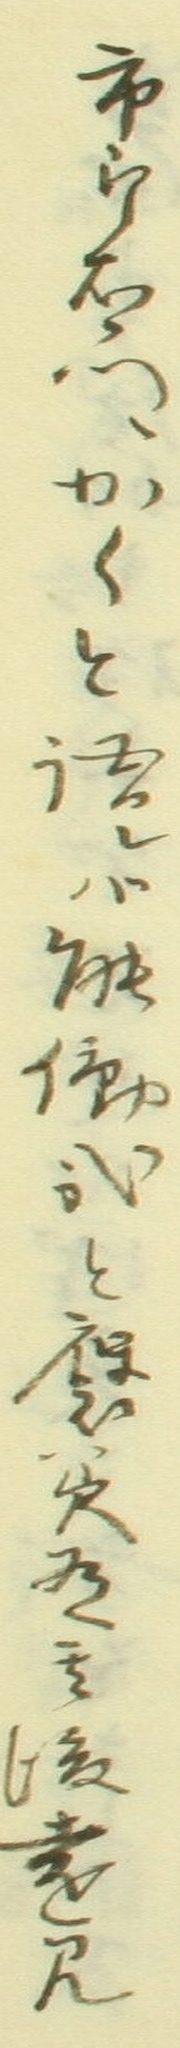市郎右衛門へかくと語れば能働にと褒美有其後と遠見

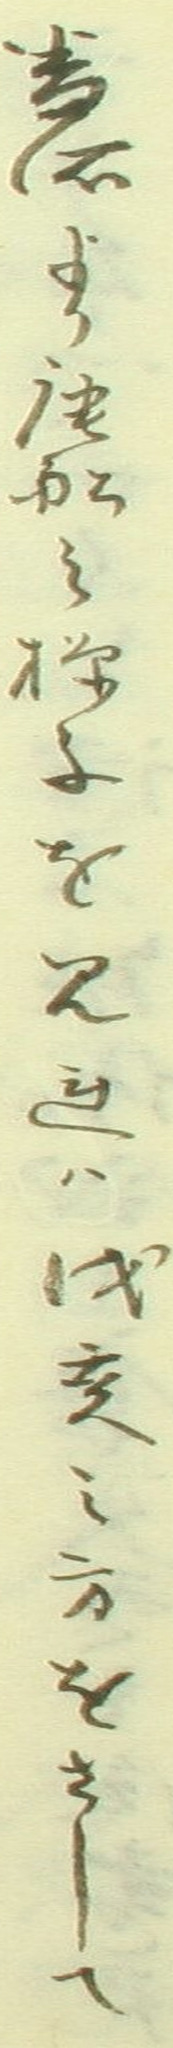番所より唐船の様子をみれは戌亥の方をさして
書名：唐船漂流記 三
